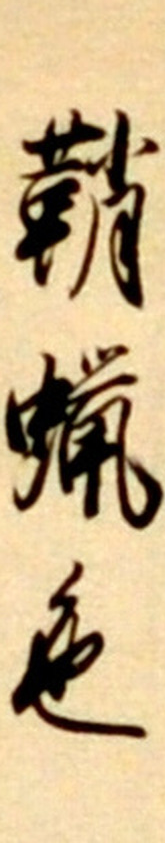鞘蠟色
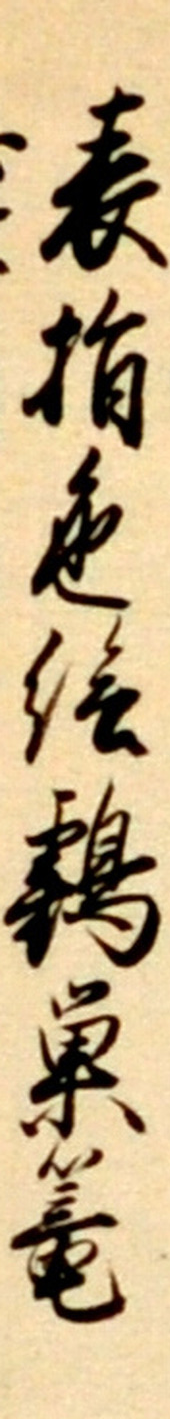表指色絵靏巣篭
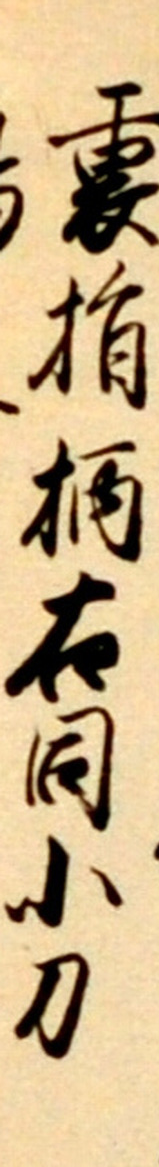裏指柄右同小刀
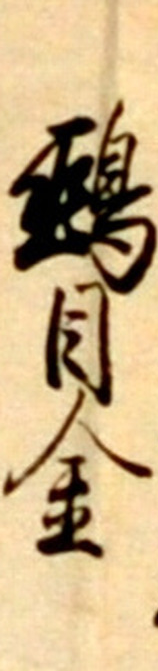鵐目金
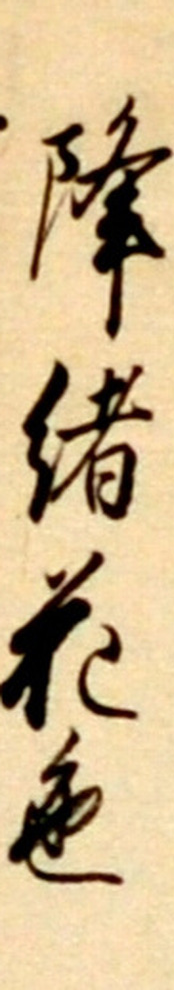降緒花色
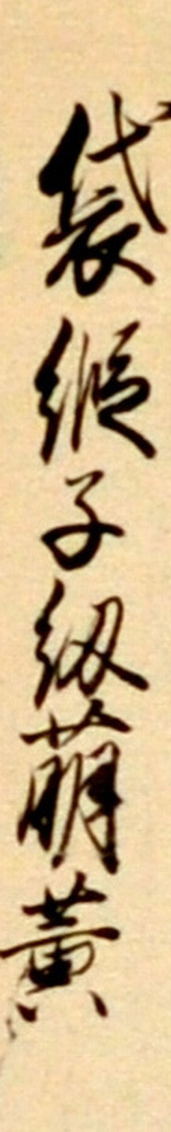袋緞子紉萌黄
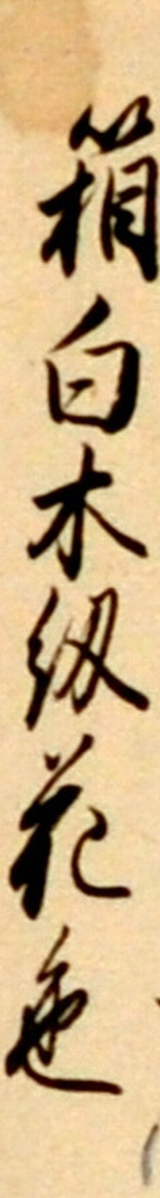箱白木紉花色

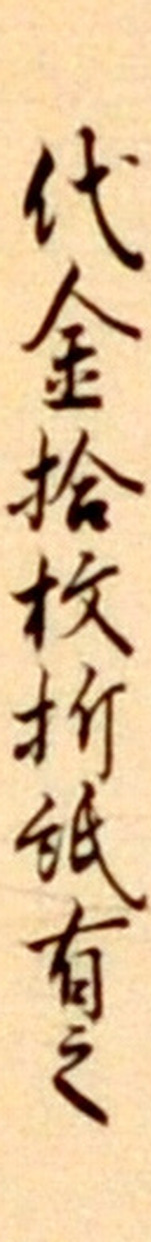代金拾枚折紙有之
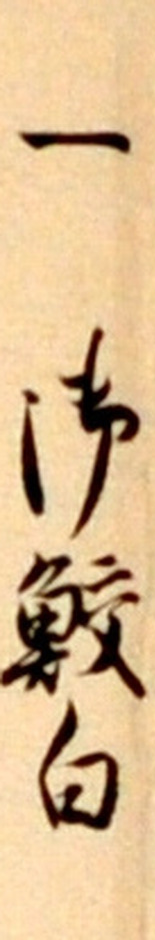一御鮫白
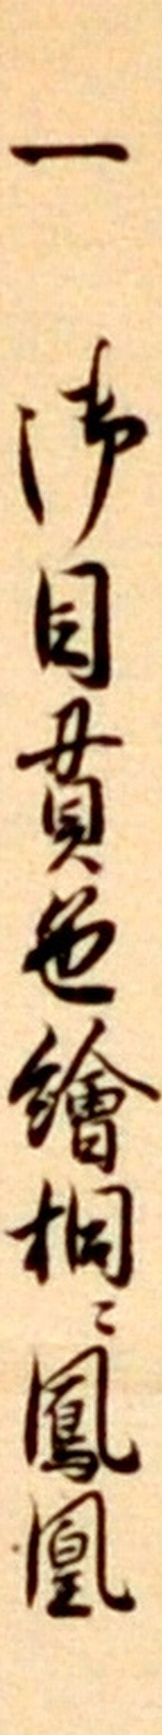一御目貫色絵桐ニ鳳凰
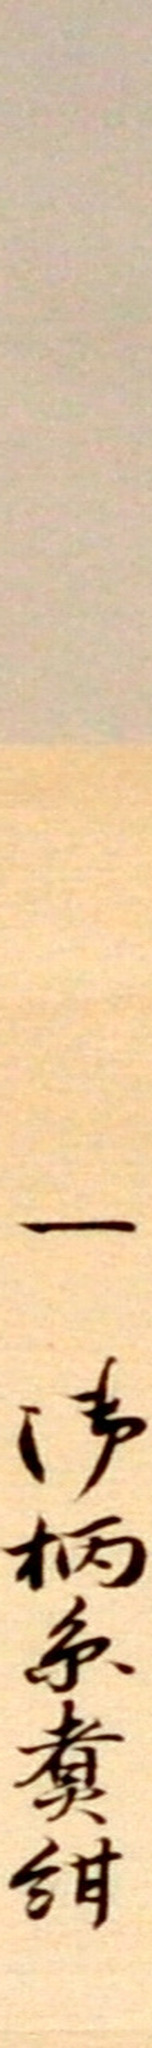一御柄糸煮紺
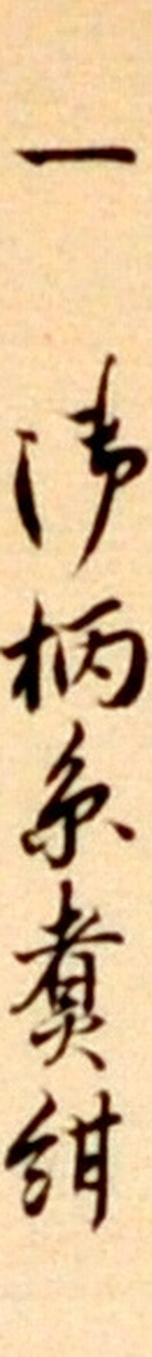一御柄糸煮紺
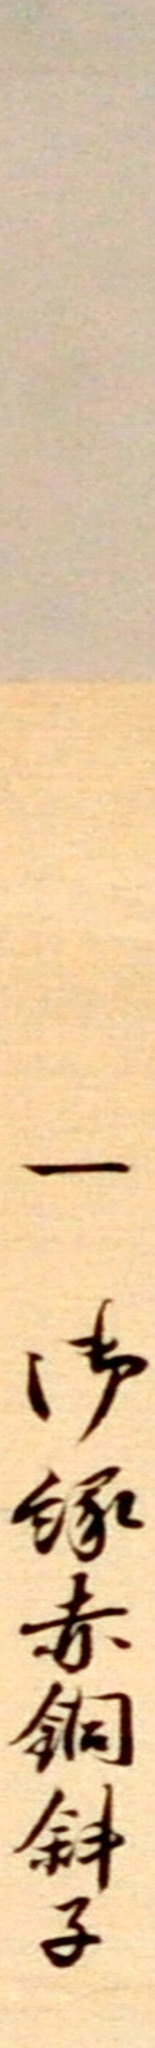一御縁赤銅斜子
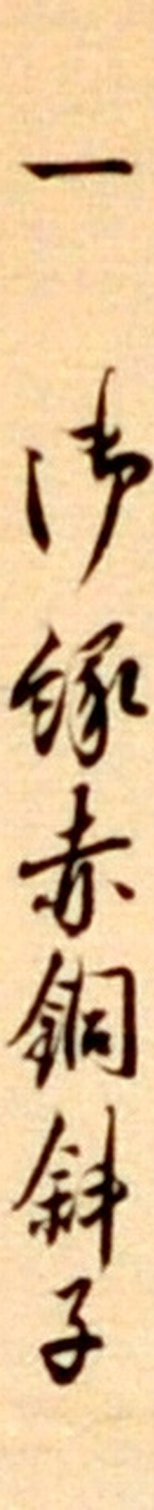一御縁赤銅斜子
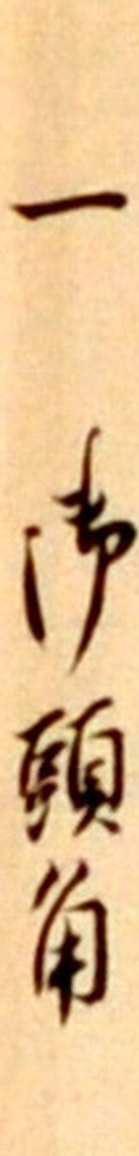一御頭角
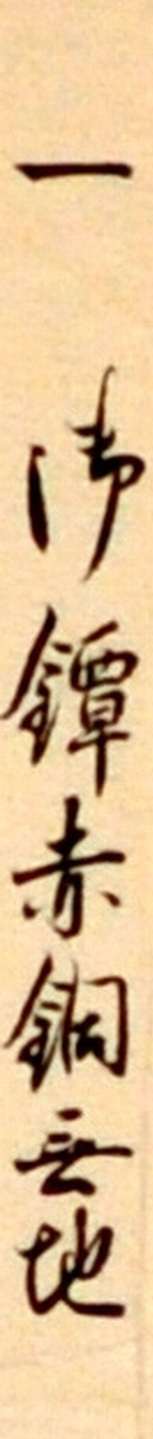一御鐔赤銅無地
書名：御刀御拵之覚
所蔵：伊那市立高遠町図書館・合同会社AMANE
